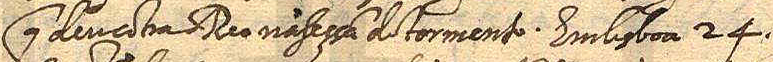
q̄ deu cōtra o Reo na sessā do tormento. Em lisboa 24.
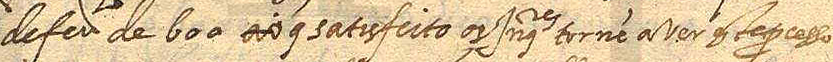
de feuro de 600 ao q̄ satisfeito os Jnqres tornē a ver este ꝓcesso.
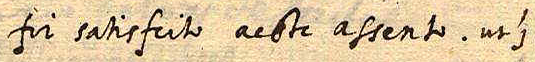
foi satisfeito a este assento. ut s̄.
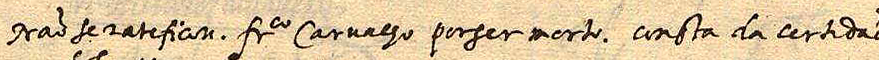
Naõ se rateficou frco Carualho por ser morto. consta da certidaõ
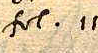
fol. 11
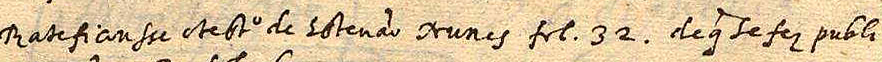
Rateficousse o testo de Esteuão Nunes fol. 32. de q̄ se fez publi
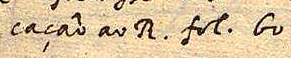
cação ao R. fol. 60.
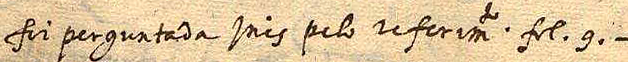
foi perguntada Jnes pelo referimto. fol. 9.
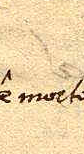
ê morto.
